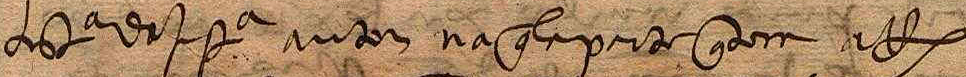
testa de Justa autor na q̄la parte q̄ toca a Rꝭ
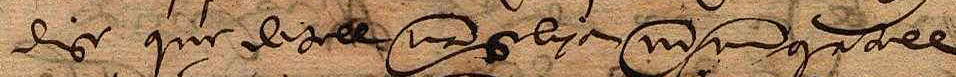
dise que de tall nā sabya nē nūqua tall
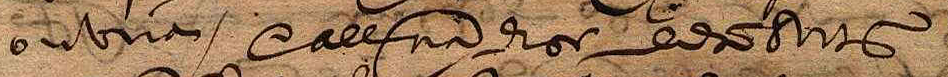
ouvira / e all nā dise do dtō Arto
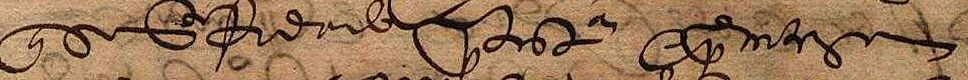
q̄ somte foi dado p̄o testa e p̄o certeza
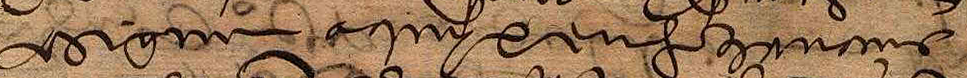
asignou aquy e eu djo trauaços
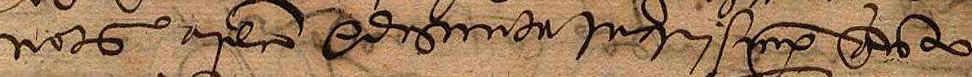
notro apl̄co e da samta Jnqujsição q̄ esto
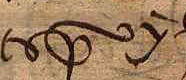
esp̄vy
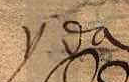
yda
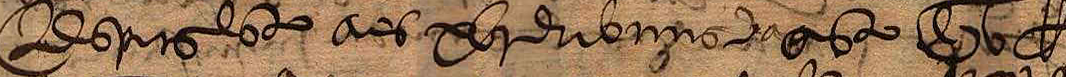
E despois desto aos xbj di do mes dagosto de j̄ bc R
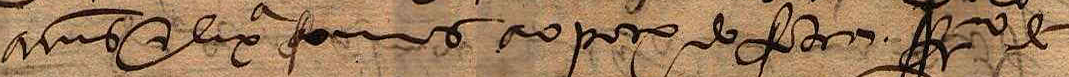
anōs ē lixa ao poço do fotea ffrco de
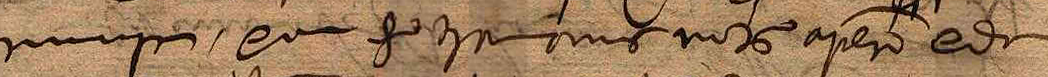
moura, e eu djo trauaços notro apl̄co e da
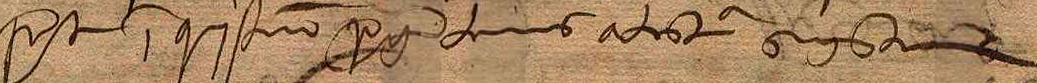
sāta j̄qujsição p̄gūtamos a testa seguj̄te
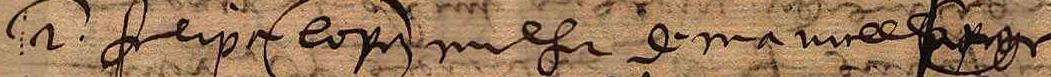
item. felipa lopez molher de manuell Jorge
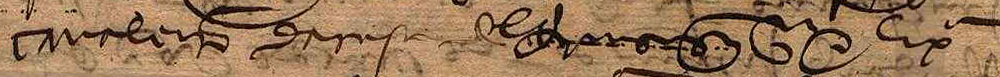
caualeiro da casa del Rej noso s̄or mor ē lixa
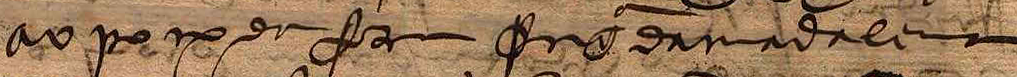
ao poço da fotea frega da madalena
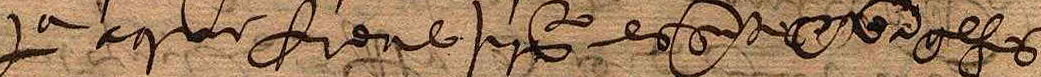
ta a que foi dado Juramto dos sātos evāgelhos
